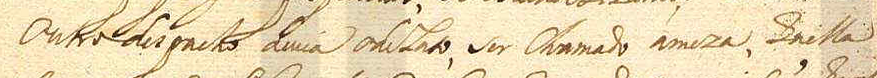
Outro despacho deuia o deLato ser Chamado a meza, E nella
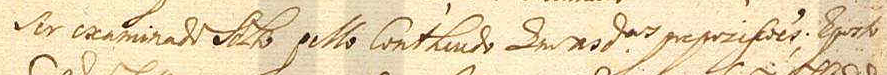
ser examinado solto pello Contheudo Em as d.as prepozissoẽs; E posto
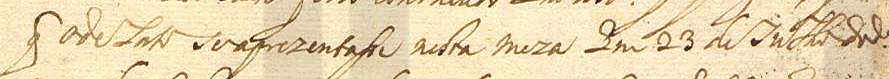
q̄ o delato se aprezentasse nesta meza Em 23 de Iulho do do
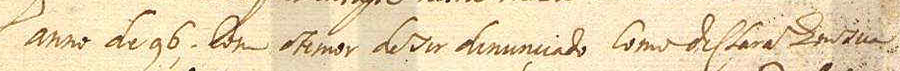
anno de 96. com o temor de ser denunciado Como deClara Em sua
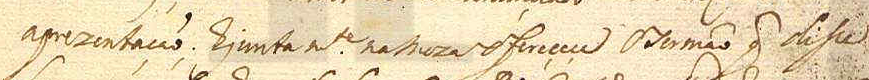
aprezentaçaõ. E juntam.te na Meza ofereceu O sermaõ q̄ disse
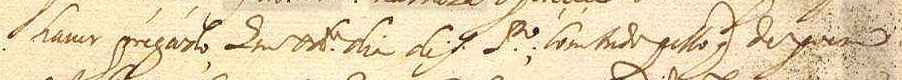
hauer pregado Em o d.o dia de S. P.o, comtudo pello q̄ depoem
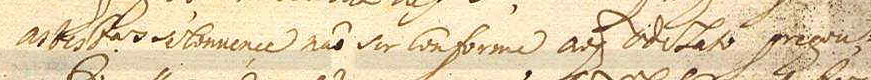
as test.as se Conuence naõ ser Conforme ao q̄ o deLato pregou,
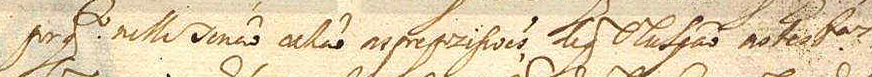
porq.to nelle senão achaõ as prepozissoẽs, de q̄ o Culpaõ as test.as
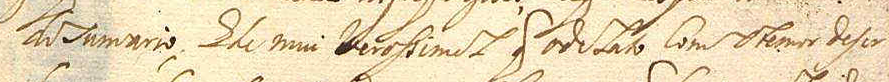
do sumario, E he mui VerossimeL q̄ o deLato Com o temor de ser
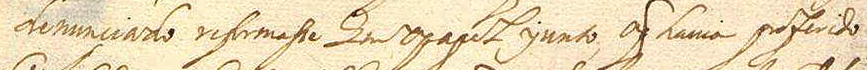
denunciado reformasse Em o papel yunto, o q̄ hauia proferido
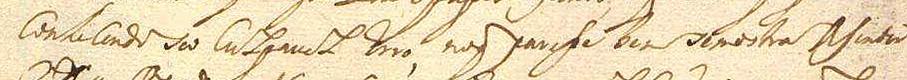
conhecendo seo CulpaueL Erro, no q̄ paresse bem se mostra Asentir
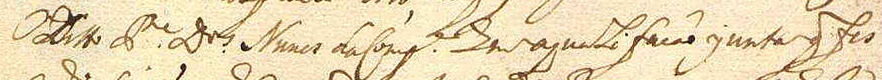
O Ditto P.e D.os Nunes da Comp.a Em a qualifaçaõ yunta q̄ fes
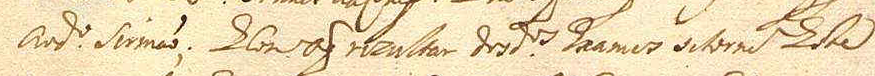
ao d.o sermaõ; E Com o q̄ rezultar dos d.os Exames se torne Este
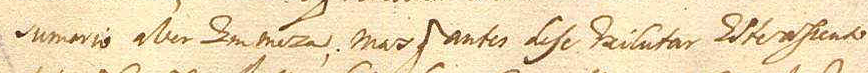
sumario a ver Em meza; mas q̄ antes de se ExiCutar Este assento
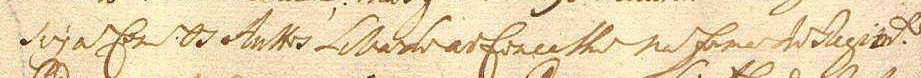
se ya fes os Auttos Levando ao Concelho na forma do Regim.to
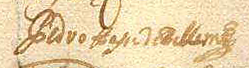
Pedro Hasse de Bellem
